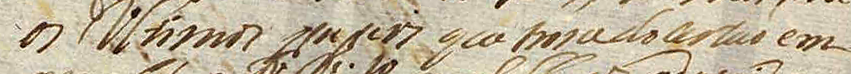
os Vltimos papeis que trosce do certaõ em
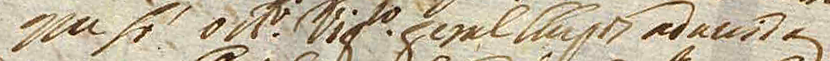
que só o d̄o. Vig.ro geral lhe pos a duuida
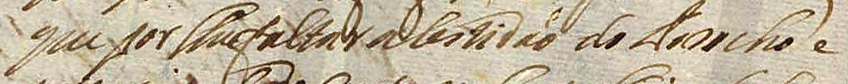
que por lhe faltar a certidaõ do Parocho e
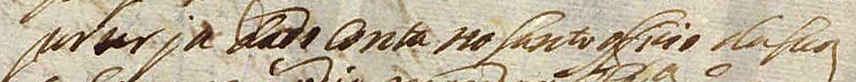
por ter ja dado conta no santo officio da sua
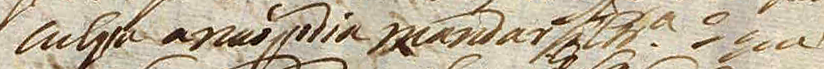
culpa a naõ podia mandar soltr.a E que
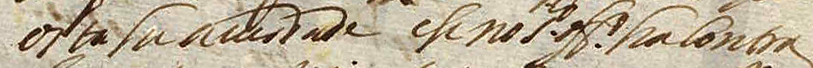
esta he a uerdade e se no s.to off.o ha contra
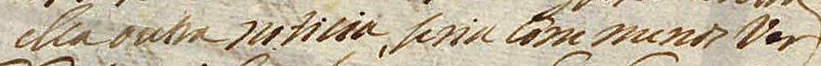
ella outra noticia, seria com menos ver
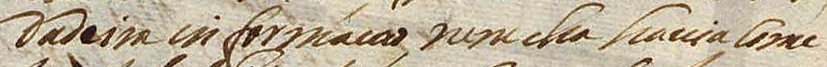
dadeira informaçaõ, nem ella hauia come
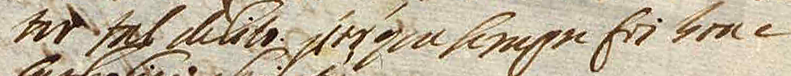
ter tal delito; porque sempre foi boa e
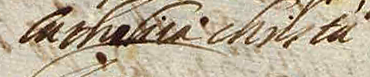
catholica christã
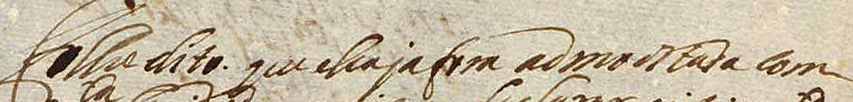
Foi lhe dito que ella ja fora admoestada com
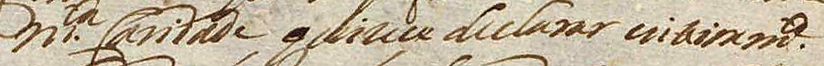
m.ta caridade quizece declarar inteiram.te
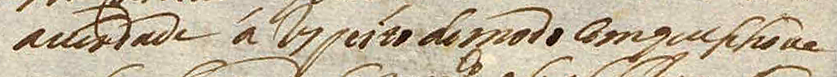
a uerdade a Respeito de modo com que se houe
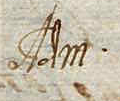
Adm.
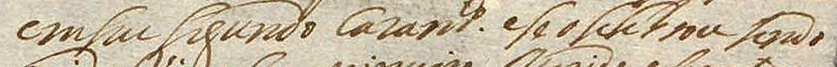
em seu segundo cazam.to e se o selebrou sendo
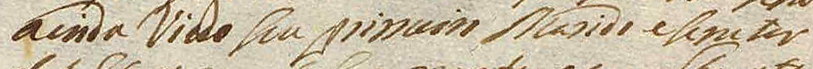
ainda viuo seu primeiro marido e sem ter
